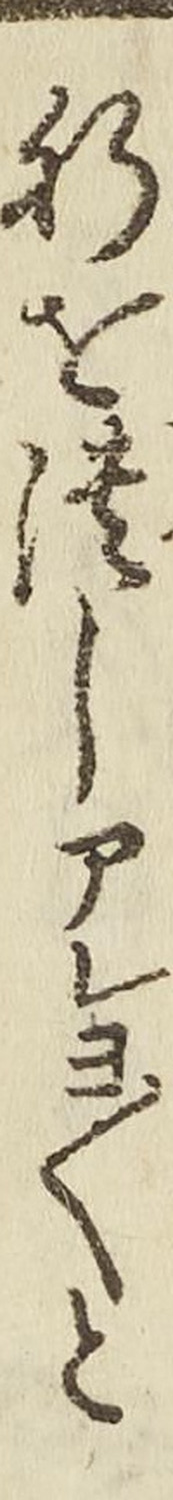肝を潰しアレヨ〳〵と
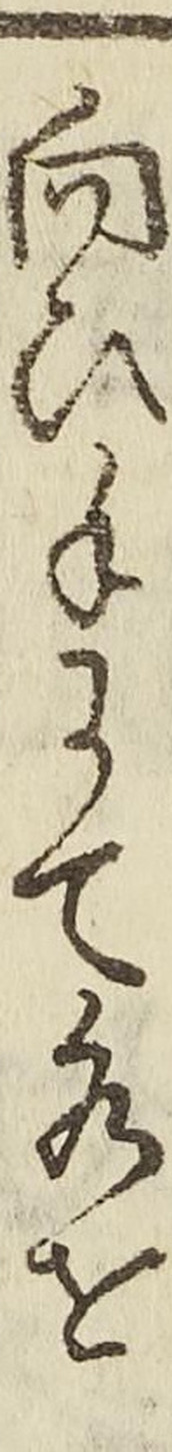向ひ手にて水を
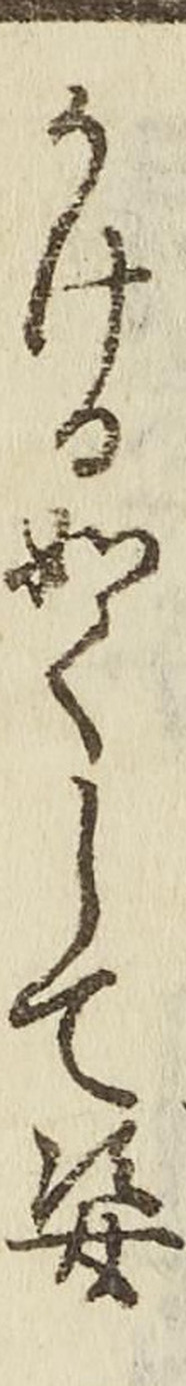かける如くして姿
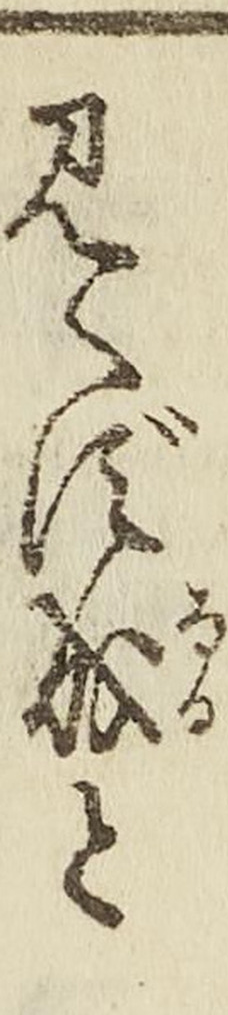見へず成と
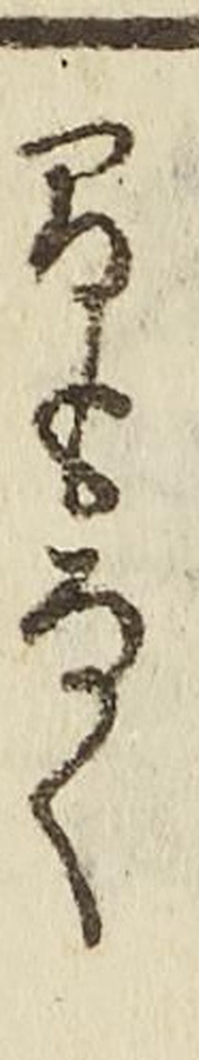間もなく
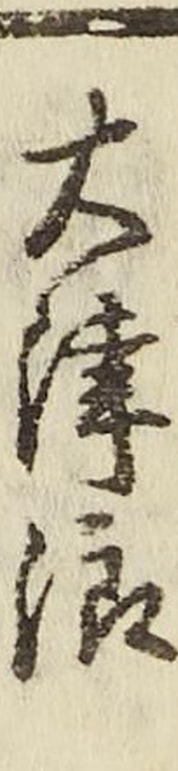大津浪
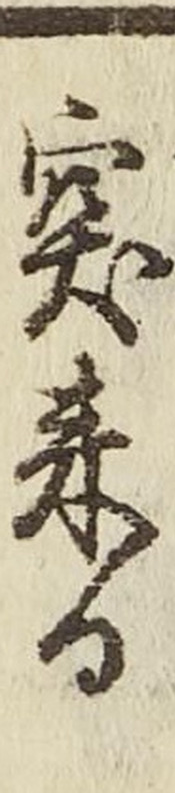突来る
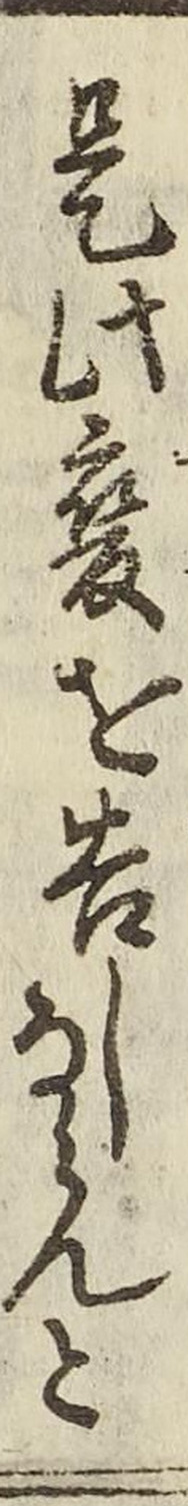是此変を告しならんと
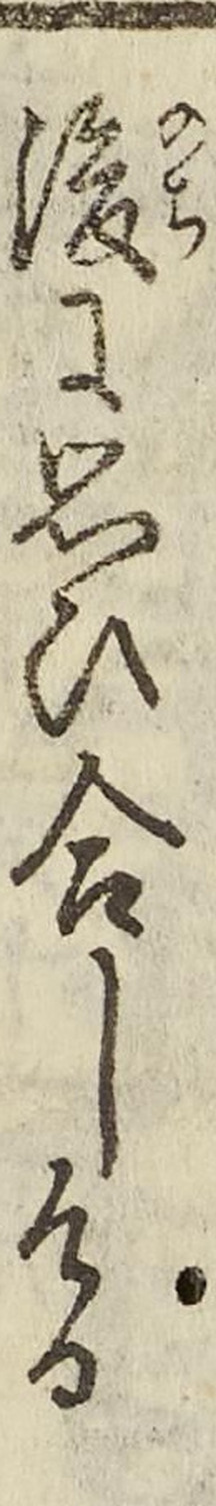後に思ひ合しける

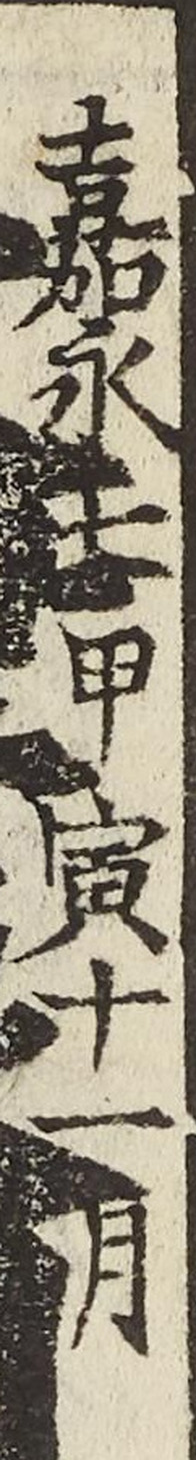嘉永七甲寅十一月
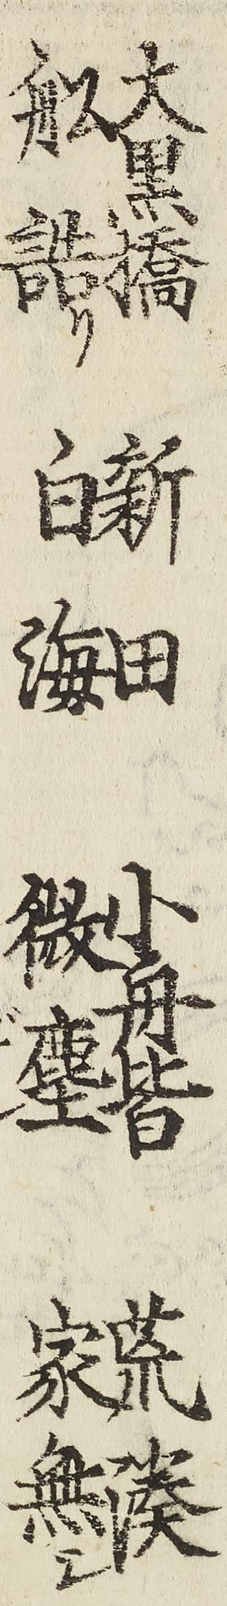大黒橋新田小舟皆荒湊
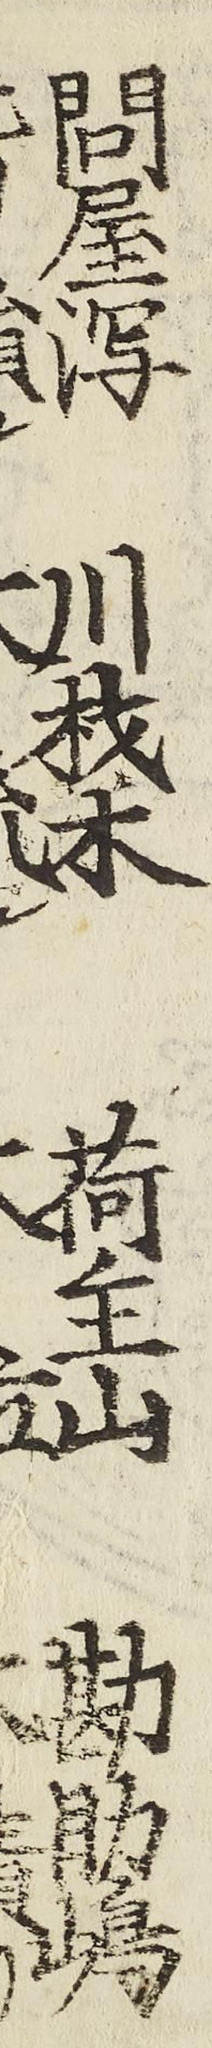問屋潟川材木荷主山勘助嶋
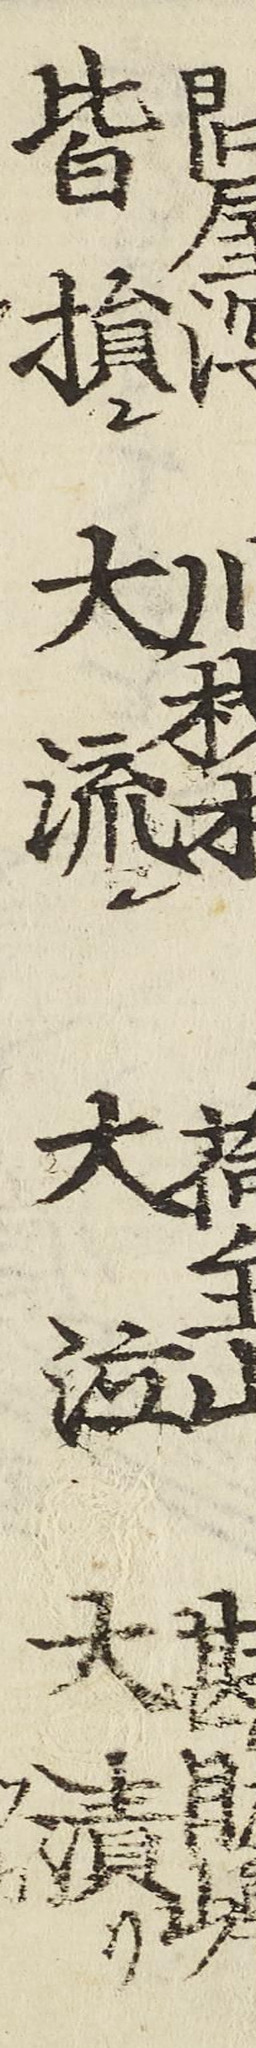皆損ン大流シ大泣大漬リ
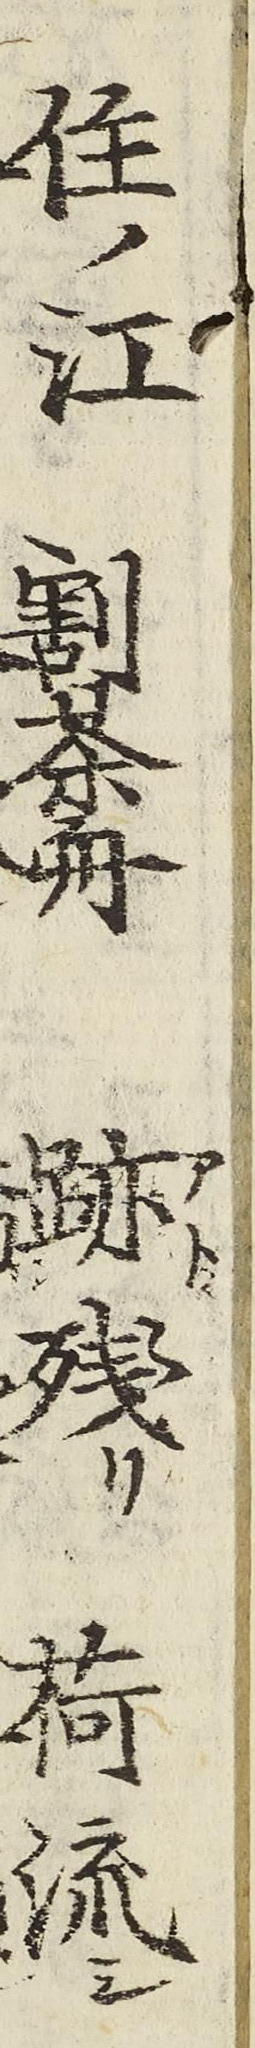住ノ江割茶船跡残リ荷流シ
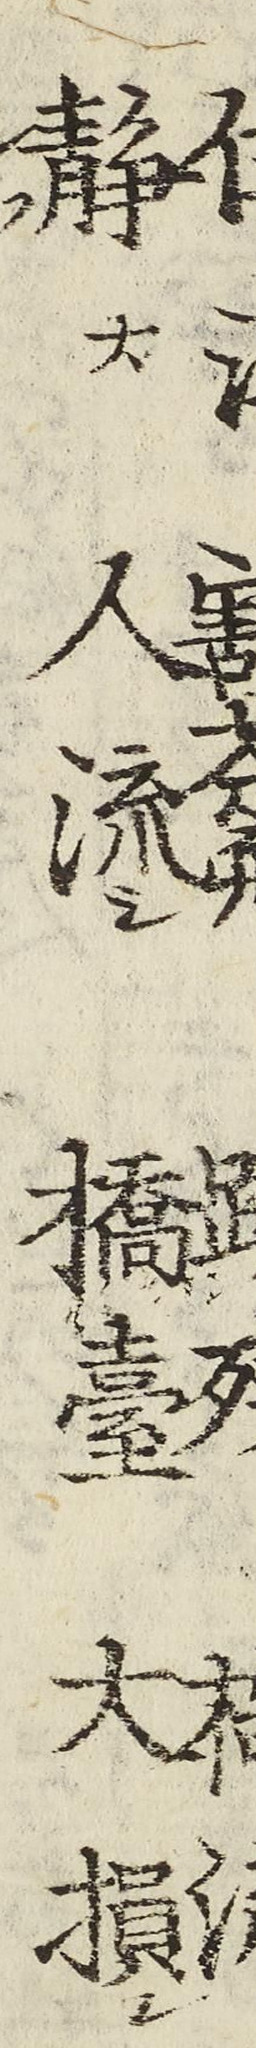静カ人流シ橋台大損シ
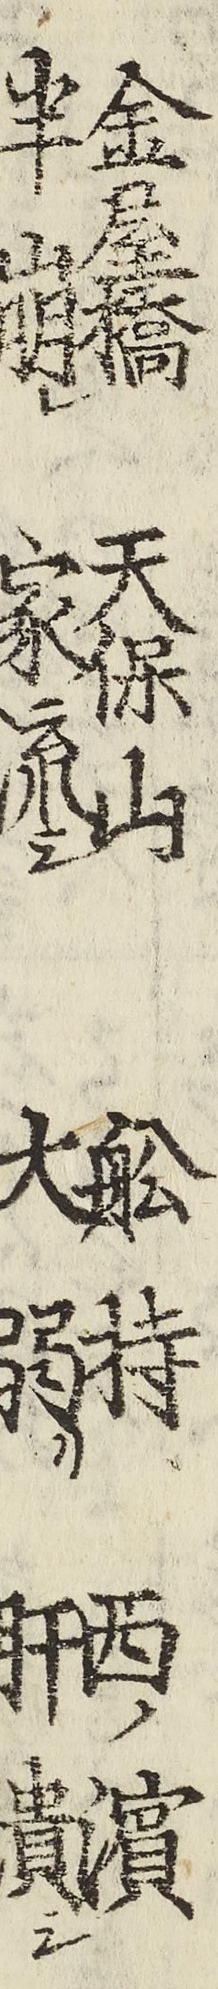金屋橋天保山船持西ノ浜
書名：地震津浪末代噺の種　全
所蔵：東京大学地震研究所図書室 Earthquake Research Institute Library, The University of Tokyo, JAPAN
